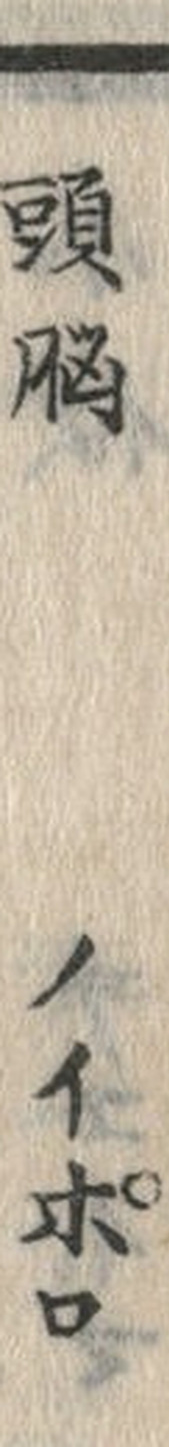頭脳ノイポロ

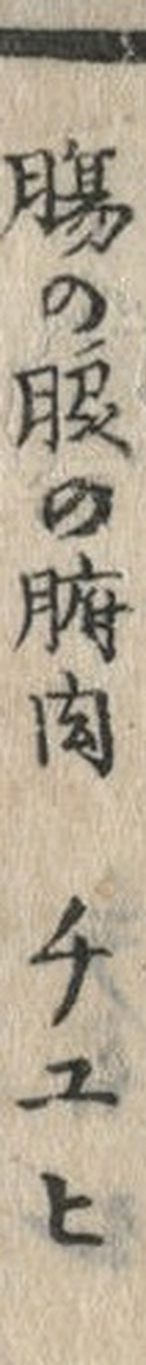腸の脇の腑肉チユヒ
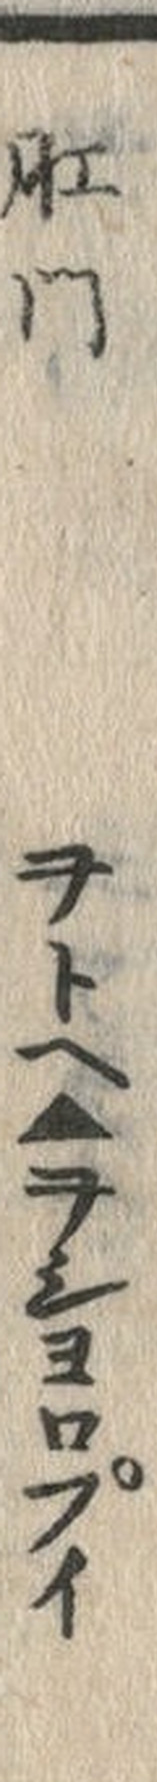肛門ヲトヘ▲ヲシヨロプイ
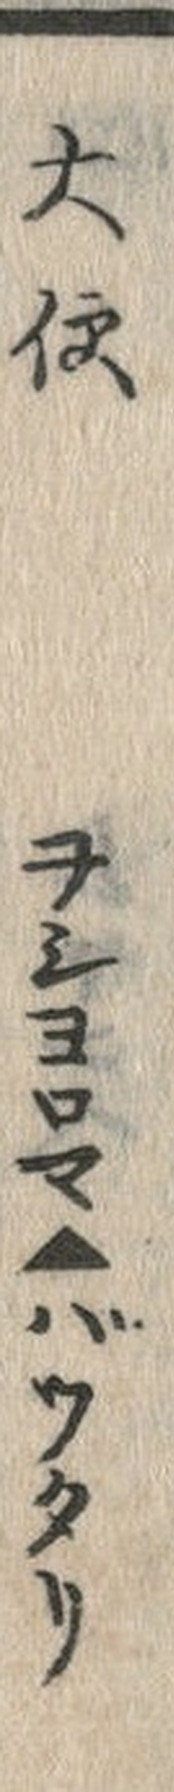大便ヲシヨロマ▲バツタリ

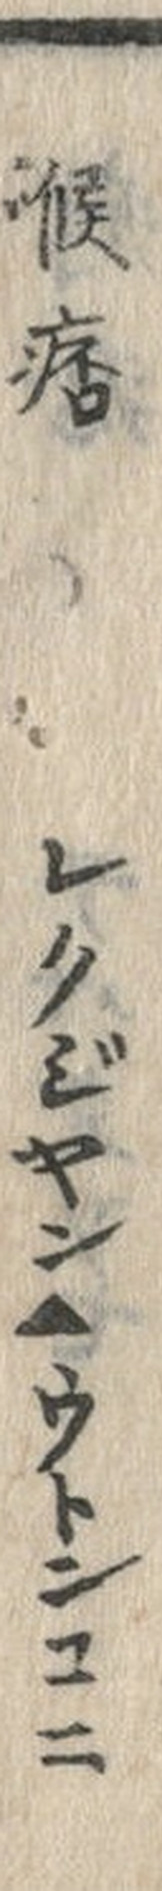喉痞レクジヤン▲ウトンコニ
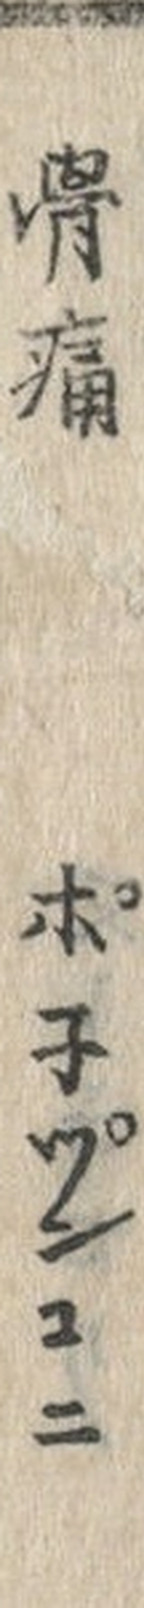骨痛ポネツ゚ンコニ

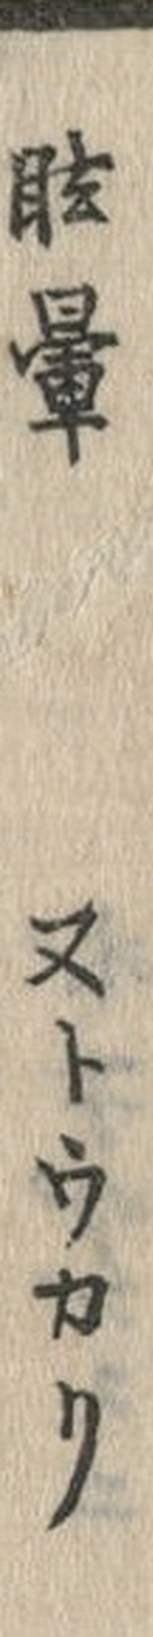眩暈ヌトウカリ
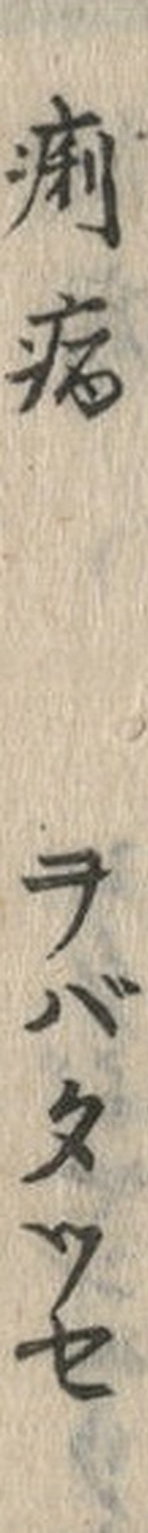痢病ヲバタツセ
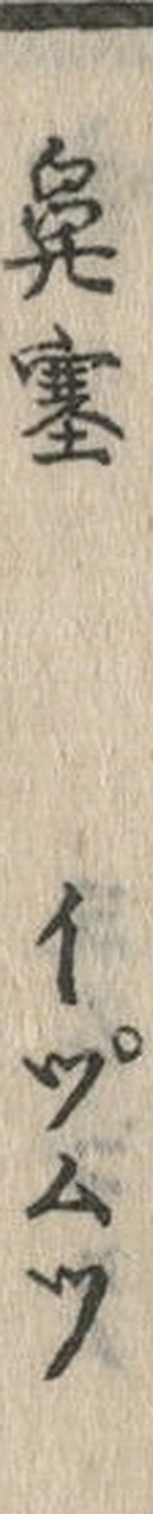鼻塞イツ゚ムツ
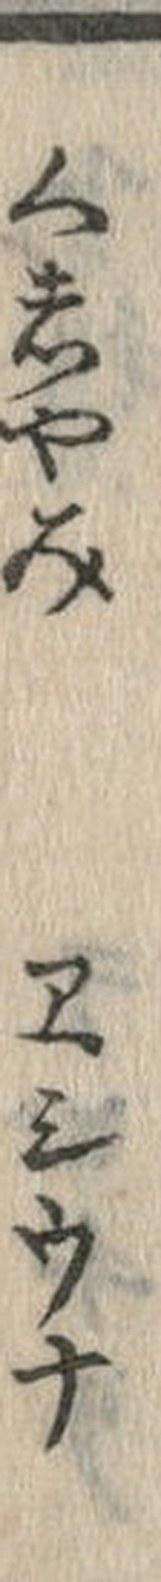くしやみヱシウナ
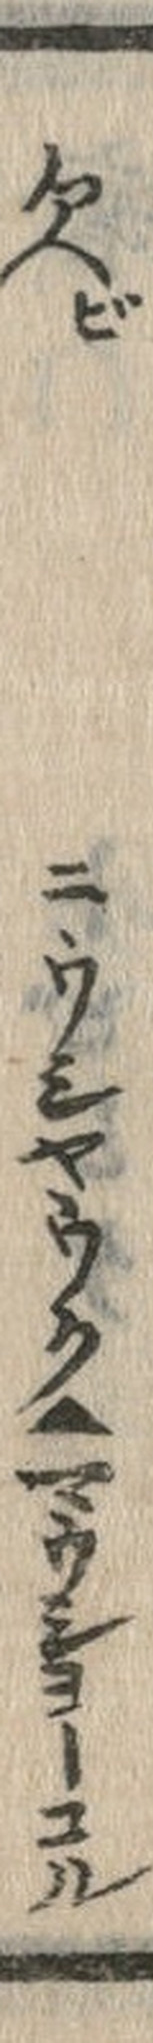欠ビニウシヤウク▲マクシヨーコル
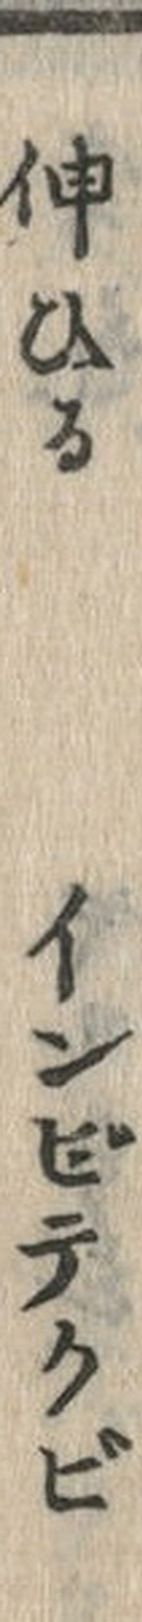伸びるインビテクビ
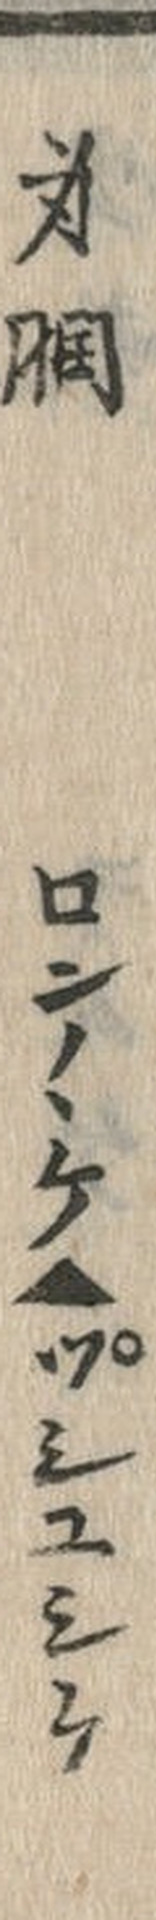身瞯ロンノヽケ▲ツ゚シユシケ
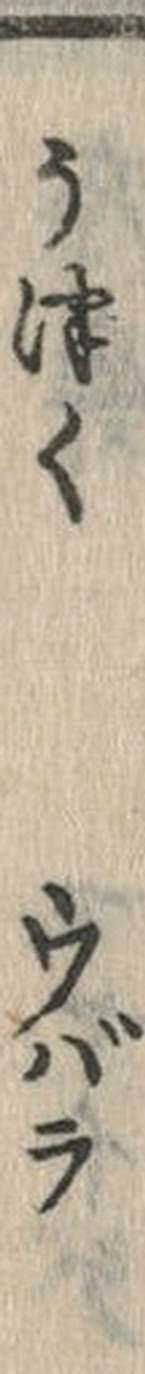うつくウバラ
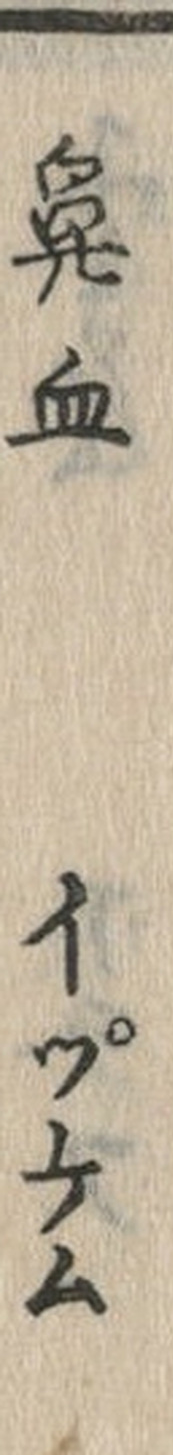鼻血イツ゚ケム
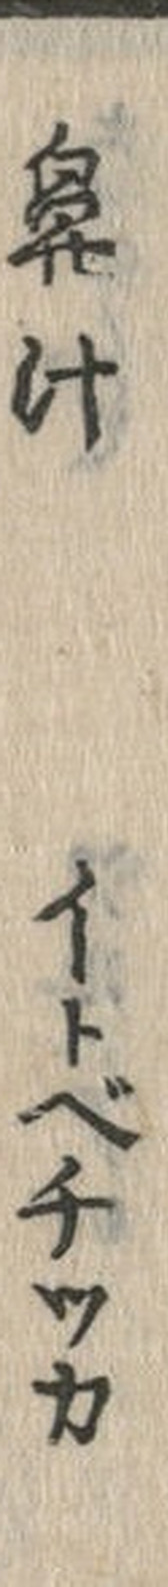鼻汁イトベチツカ
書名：蝦夷方言藻汐草　乾巻
